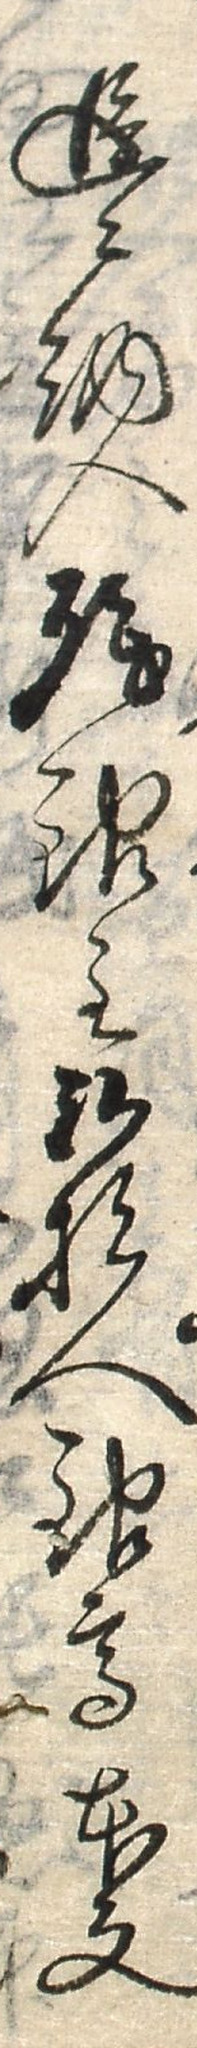追々納入残銀銀主弐拾人銀高本文
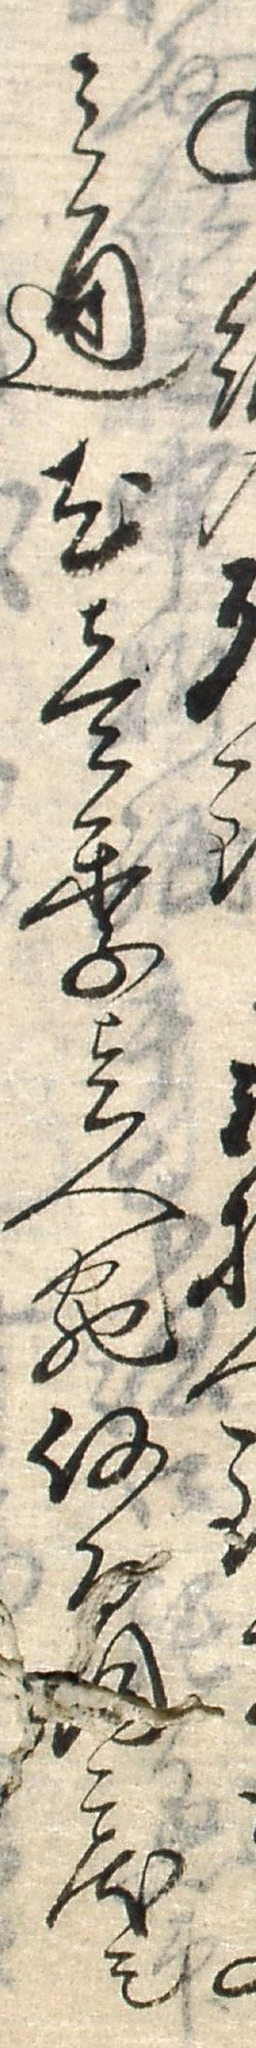之通尤壱季壱人宛何百目戻し
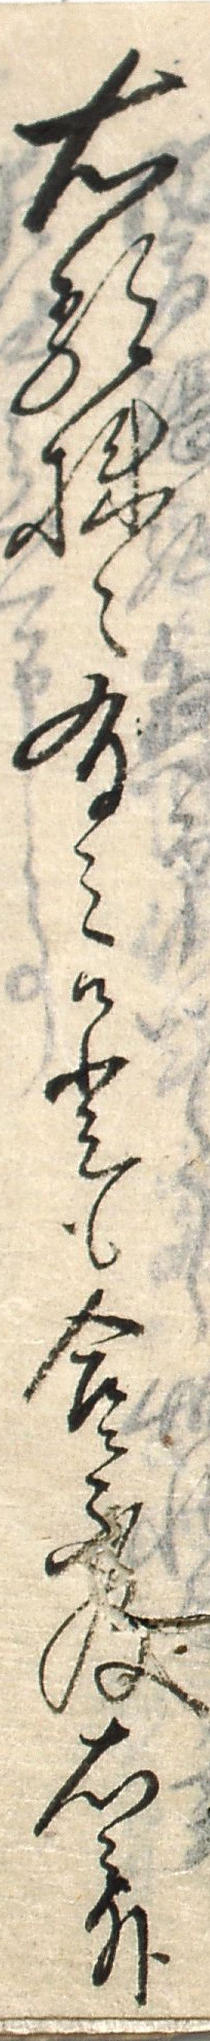右類株々有之候とも合に不及右之外
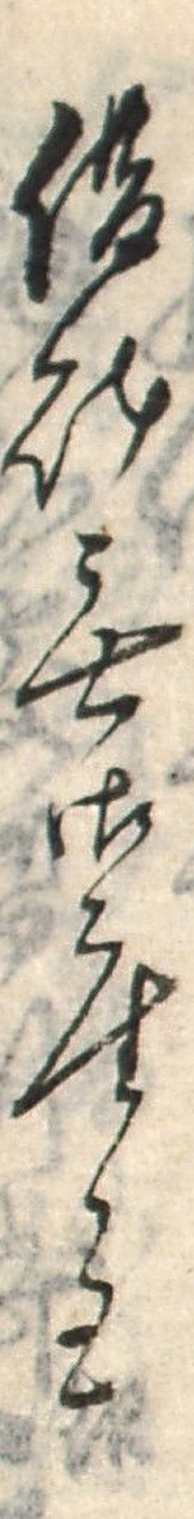借財無御座候以上
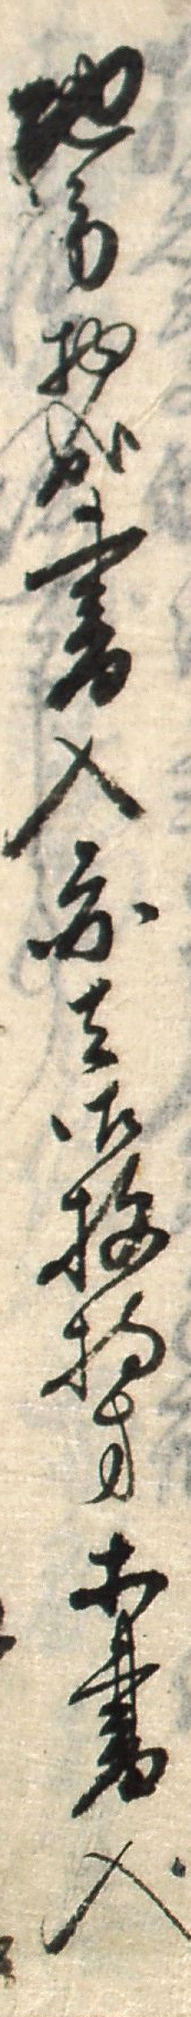地方物成書入亦は御扶持方等書入
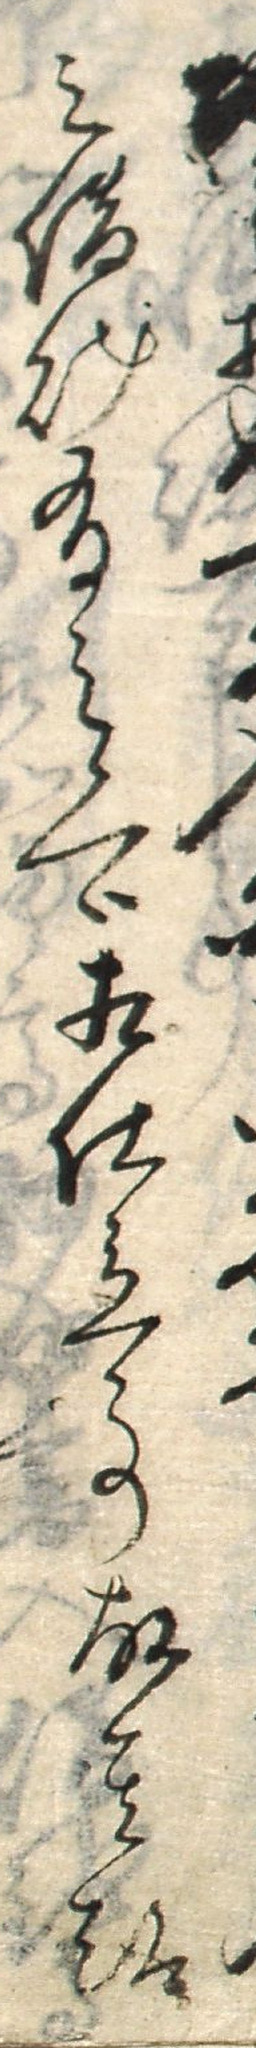之借財有之候はゝ相仕立事故其趣
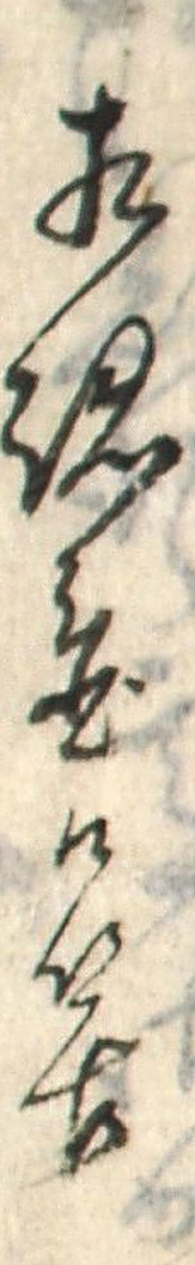相認置候筈

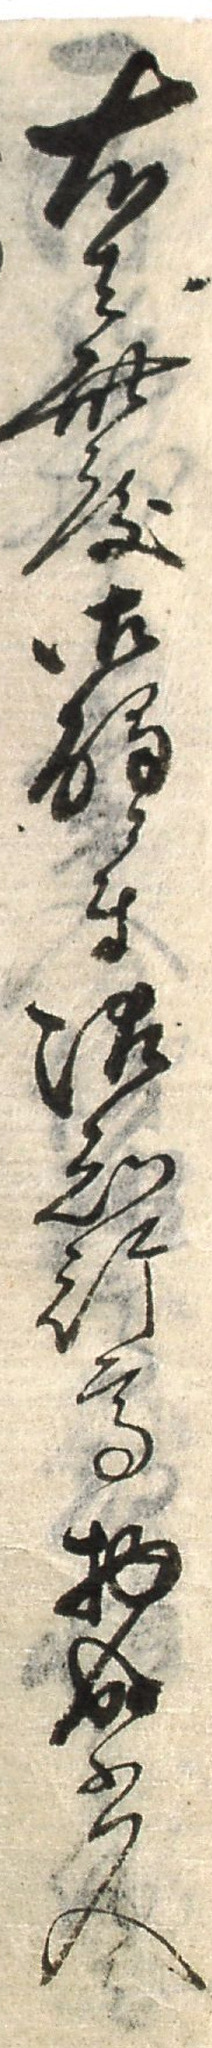右は此度御触に付御知行高物成書入
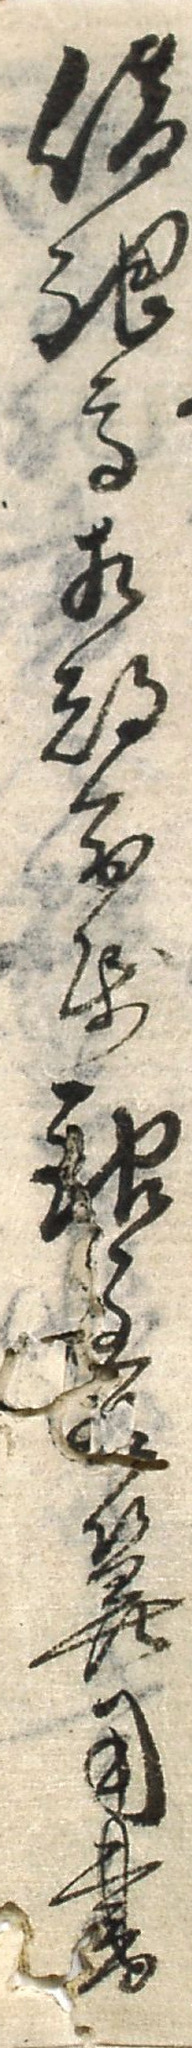借銀高相都別紙銀主共算用書
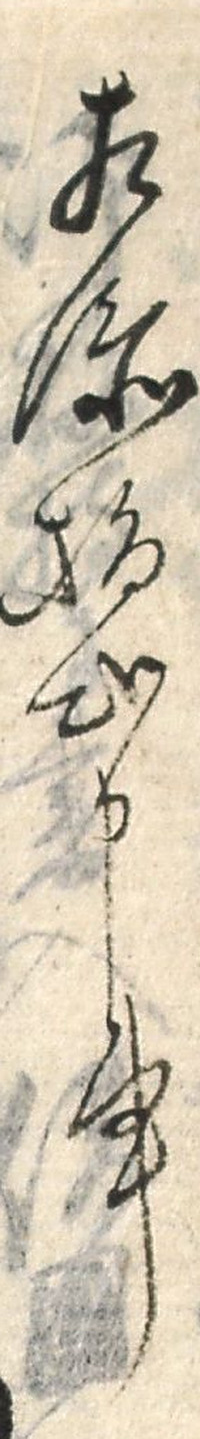相添指出申事
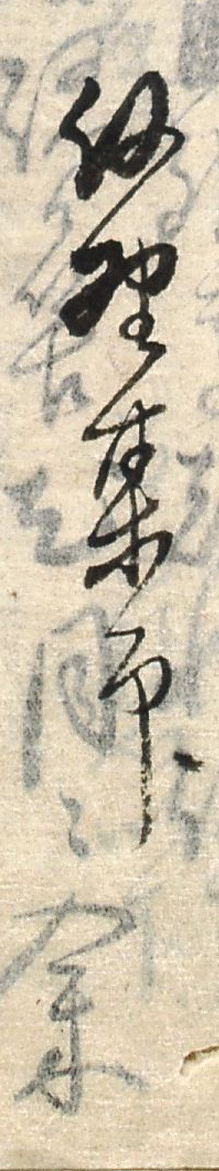何野某印
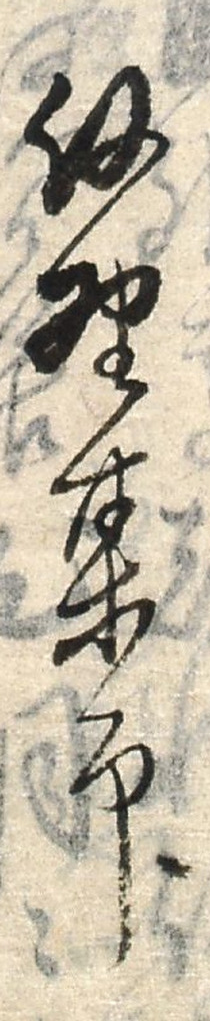何野某印
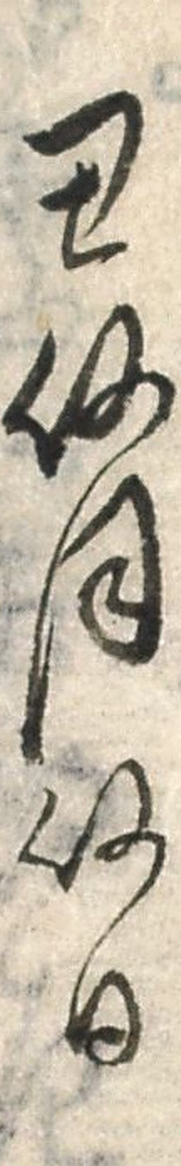丑何月何日
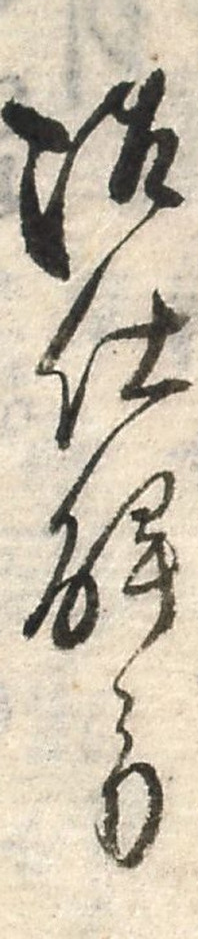御仕解方
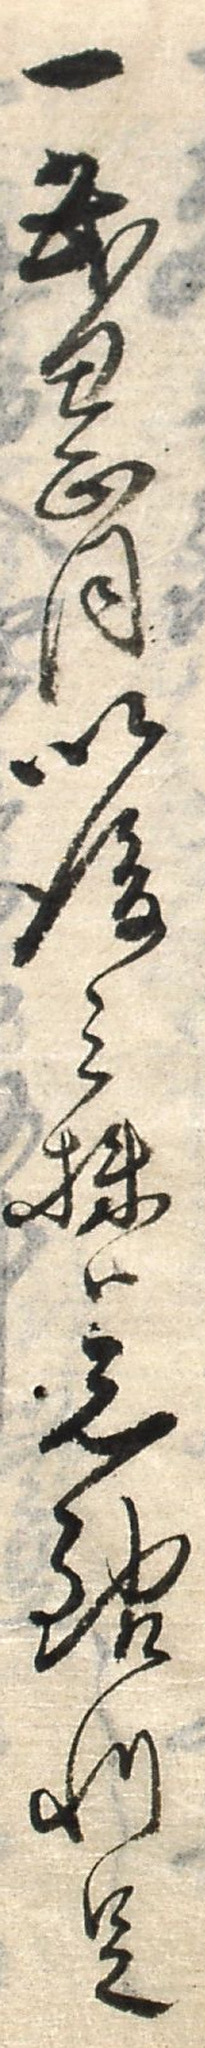一当丑正月以後之株は元銀利足
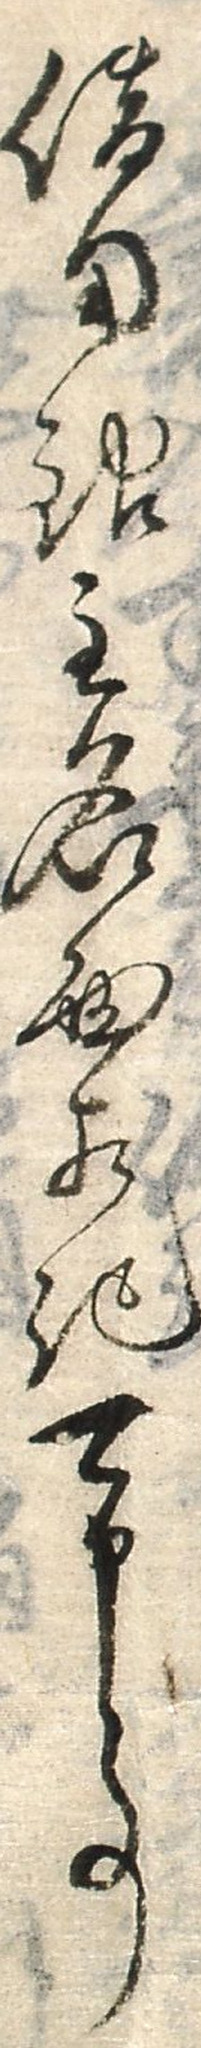借用銀主名面相記可申事
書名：御家中并無格御奉公人借銀御仕解一件御書付写其余共控
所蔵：鳴門教育大学 Naruto University of Education
